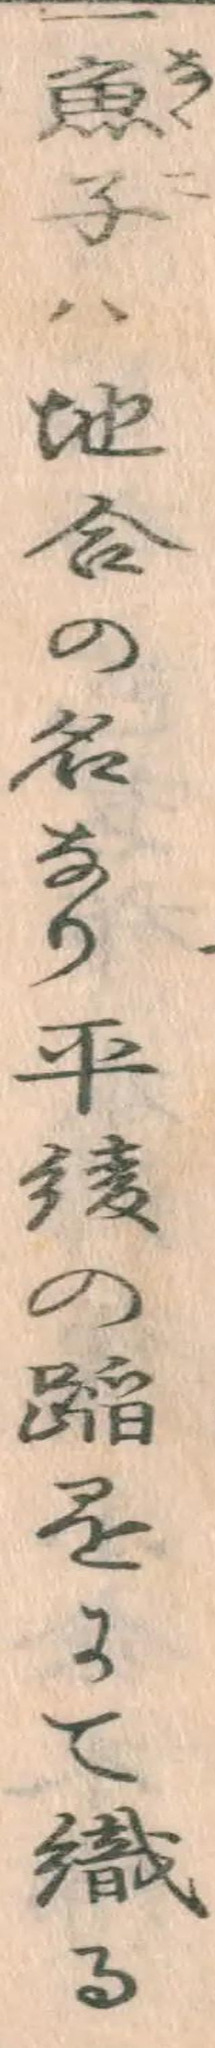一魚子は地合の名なり平綾の蹈懸にて織る
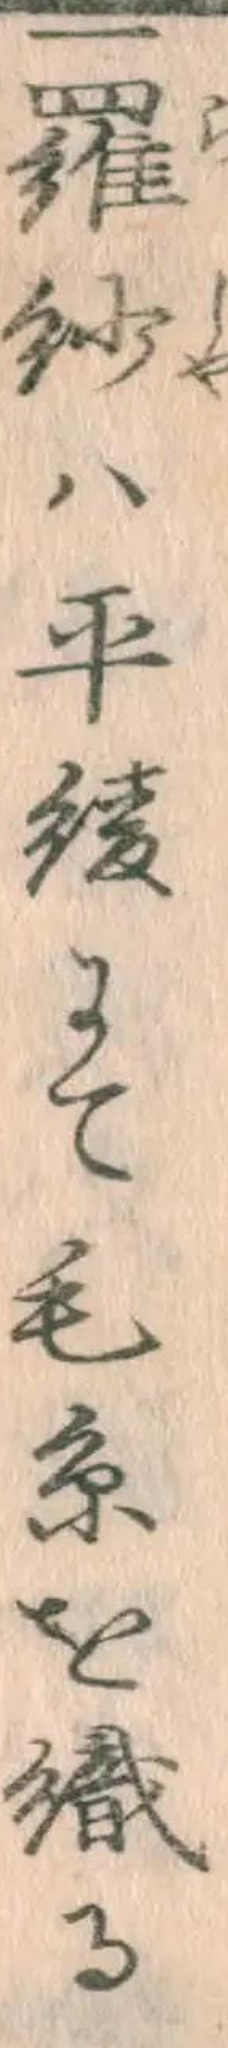一羅紗は平綾にて毛糸を織る
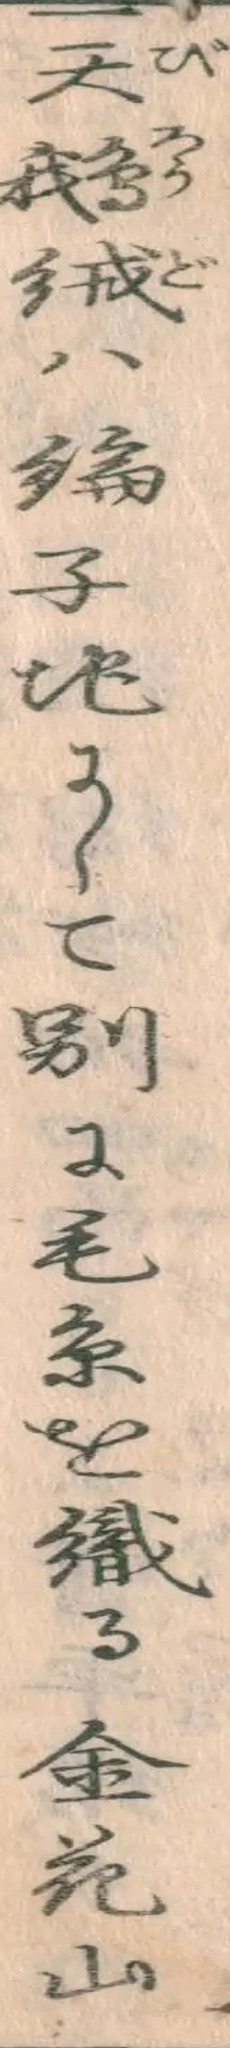一天鵝絨は綸子地にして別に毛糸を織る金花山
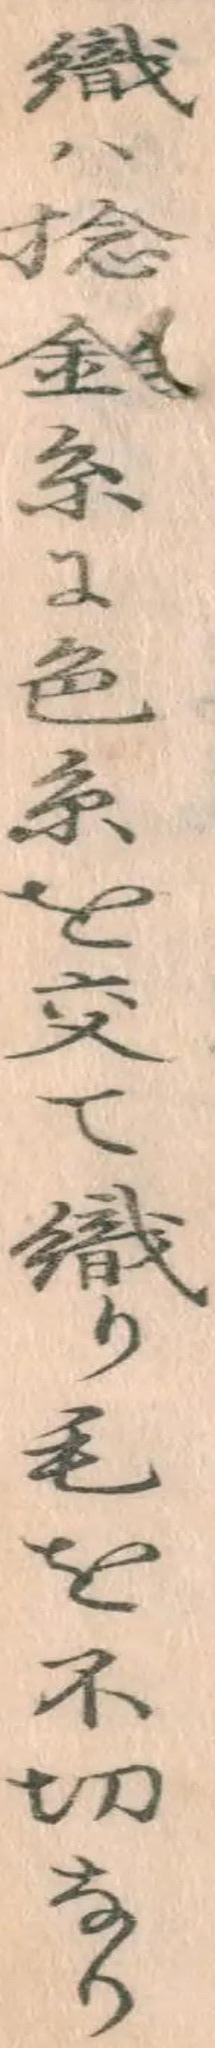織は捻金糸に色糸を交て織り毛を不切なり
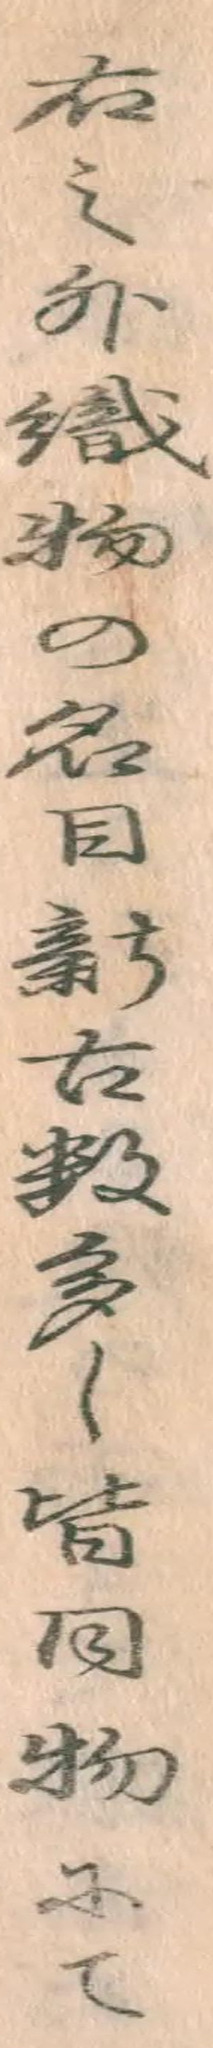右之外織物の名目新古数多し皆同物にて
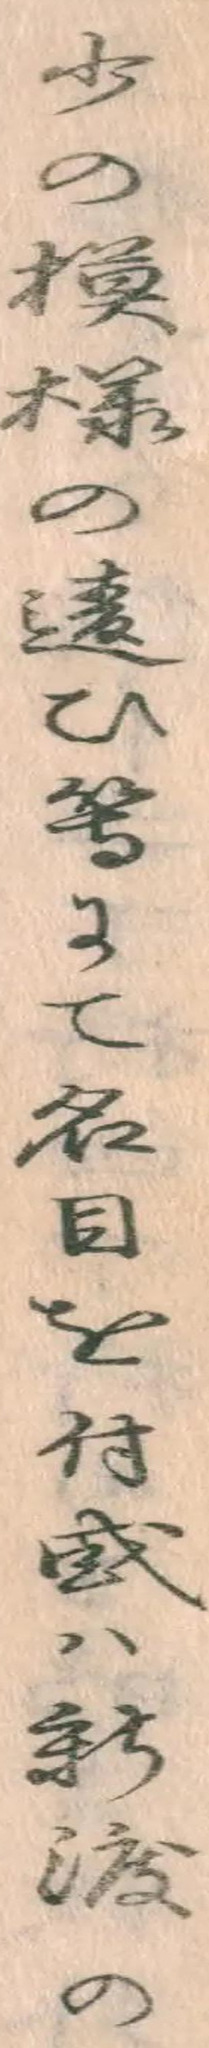少の模様の違ひ等にて名目を付或は新渡の
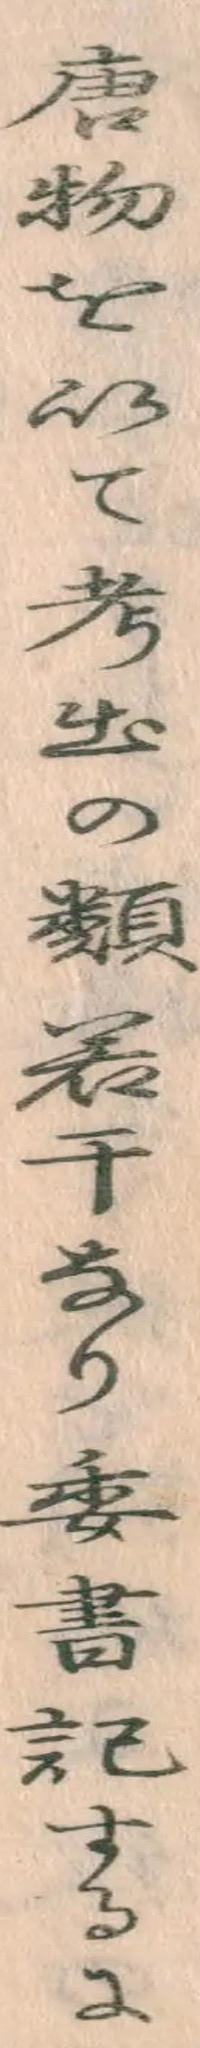唐物を以て考出の類若干なり委書記するに
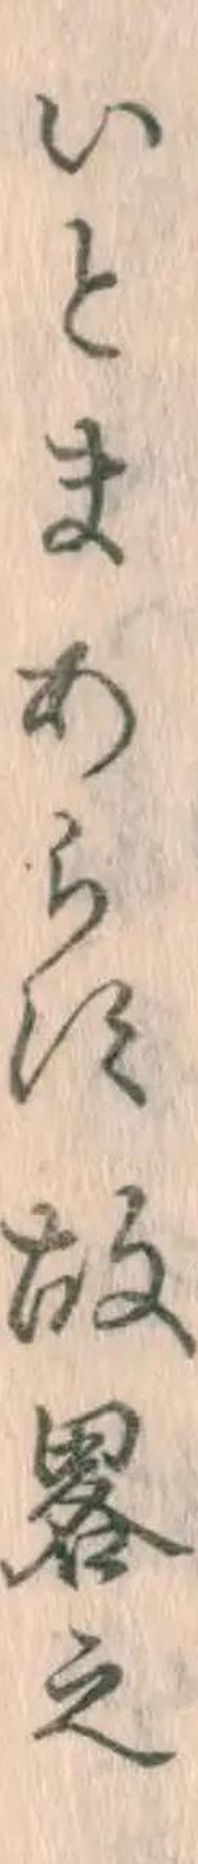いとまあらす故略之
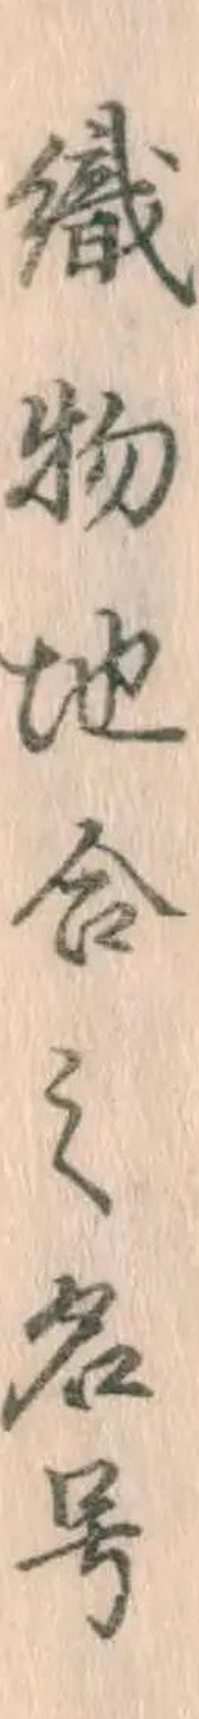織物地合之名号
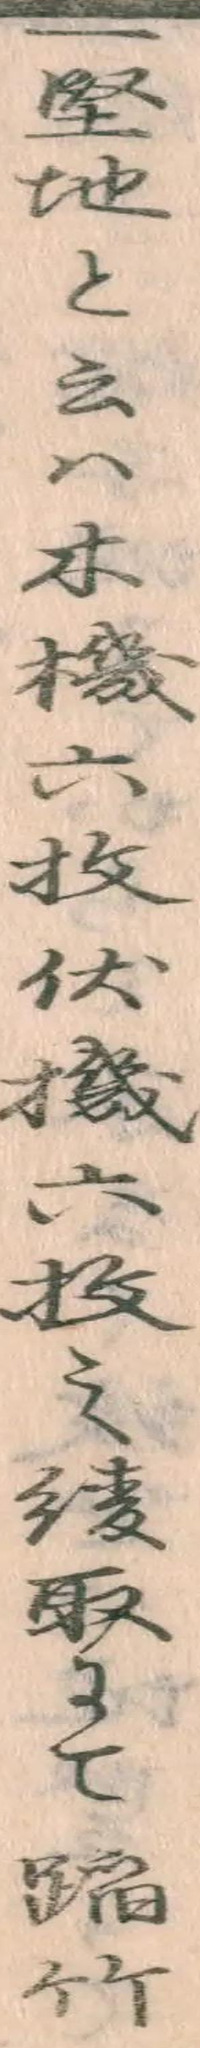一堅地と云は木織六枚伏機六枚之綾取にて蹈竹
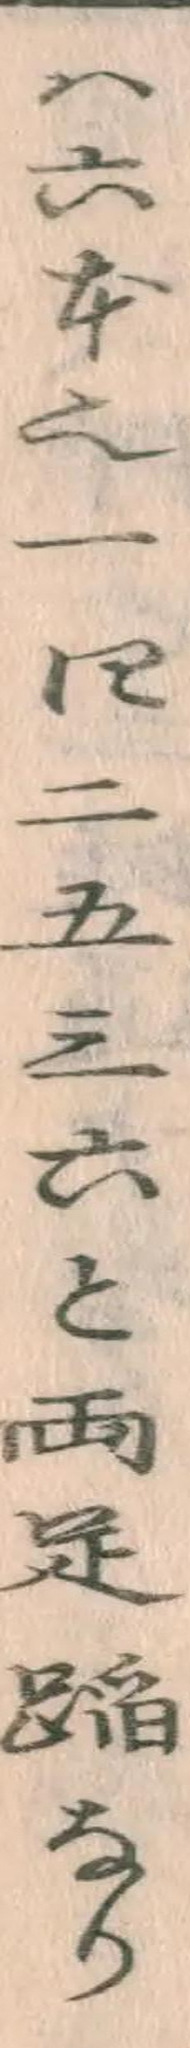は六本也一四二五三六と両足蹈なり
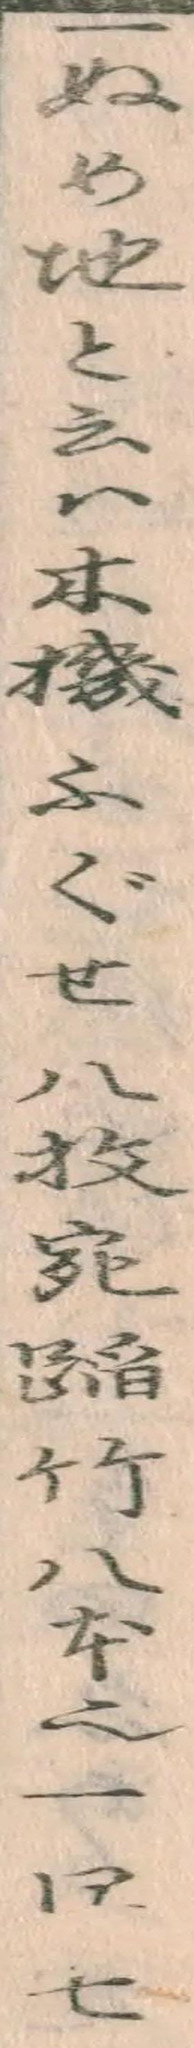一ぬめ地と云は木機ふぐせ八枚宛蹈竹八本也一四七
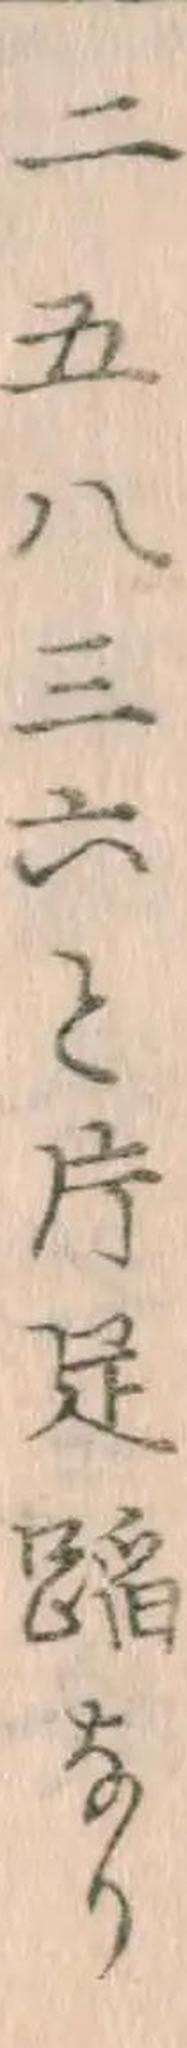二五八三六と片足蹈なり
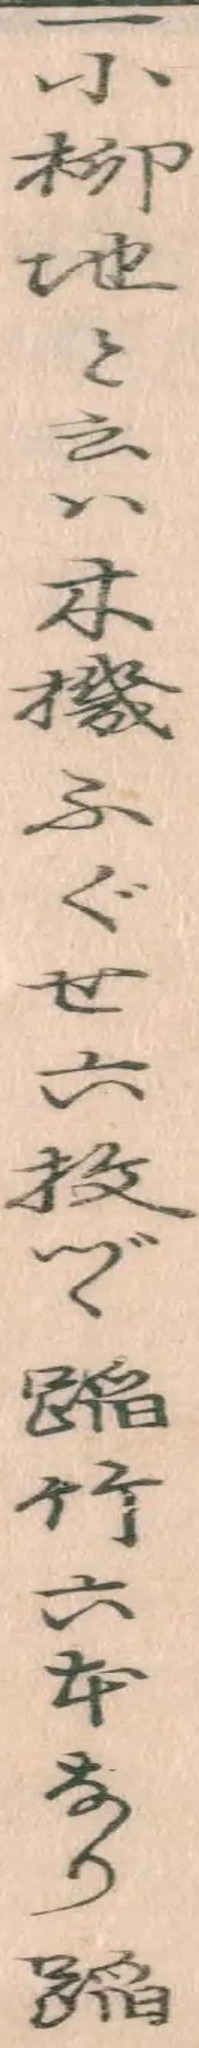一小柳地と云は木機ふぐせ六枚づゝ蹈竹六本なり蹈
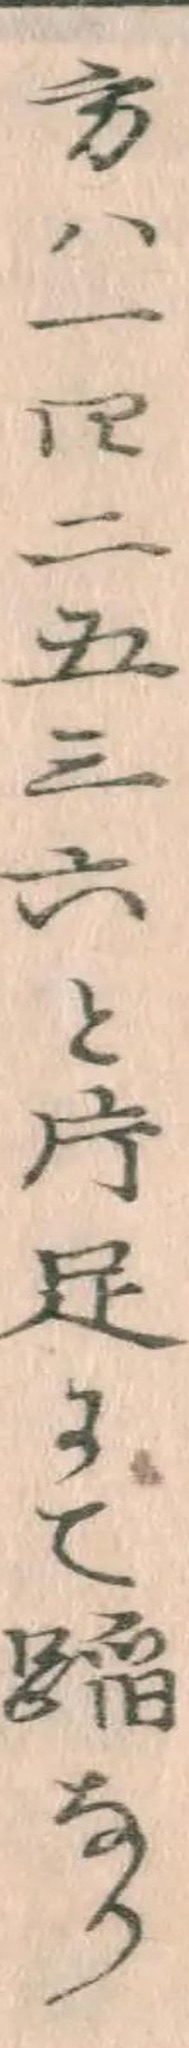方は一四二五三六と片足にて蹈なり
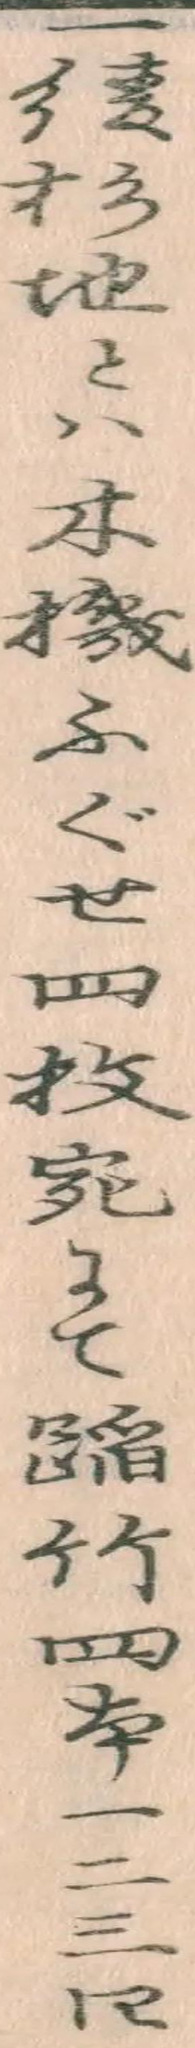一綾杉地とは木機ふぐせ四枚宛にて蹈竹四本一二三四
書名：機織彙編 5巻. [2]
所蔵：国立国会図書館 National Diet Library, JAPAN
